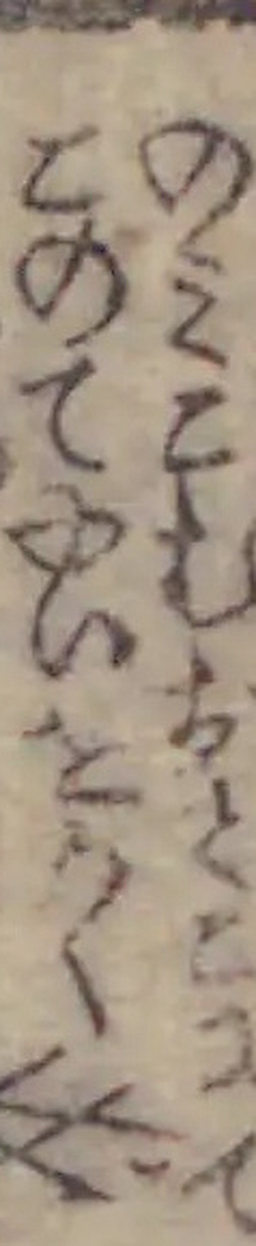このてやいをかく
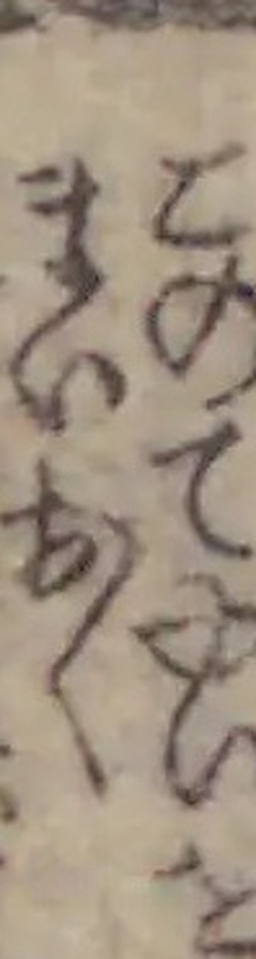まいおく
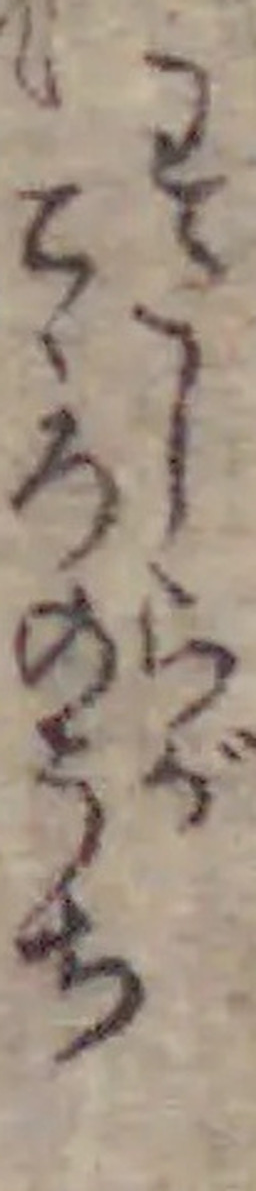こゝろのうち
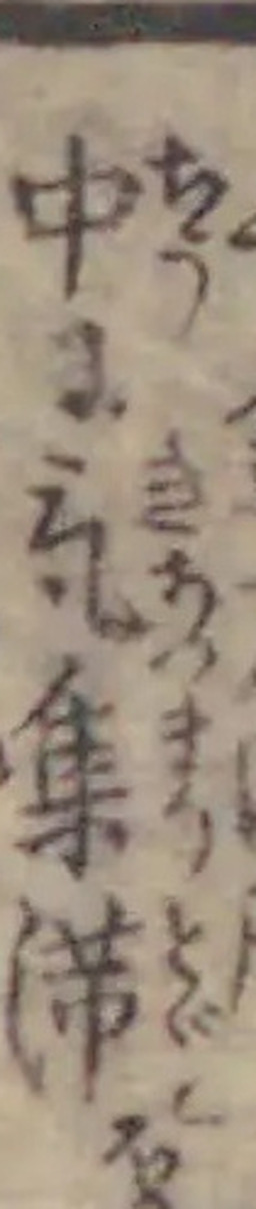中に気集滞
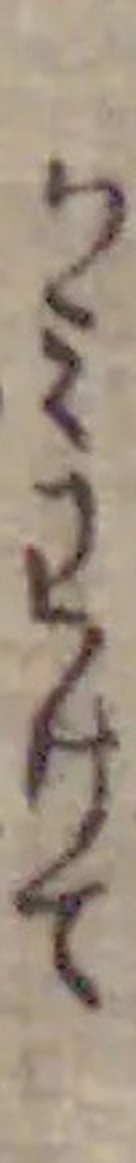かみわけて
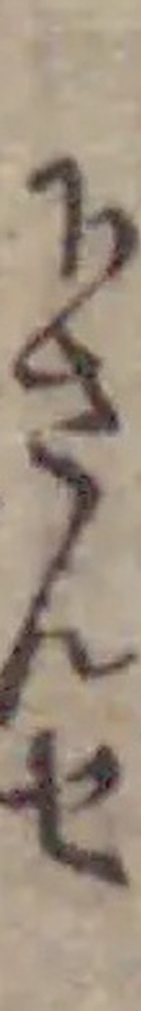下さんせ
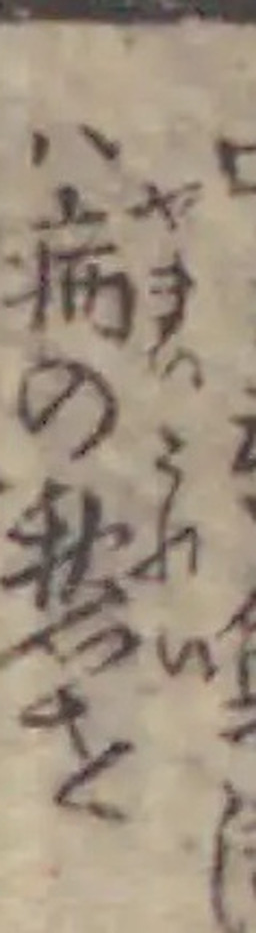は病の愁を
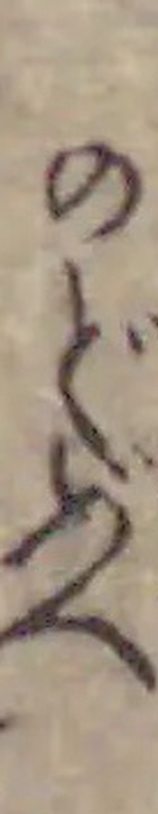のどぶへ
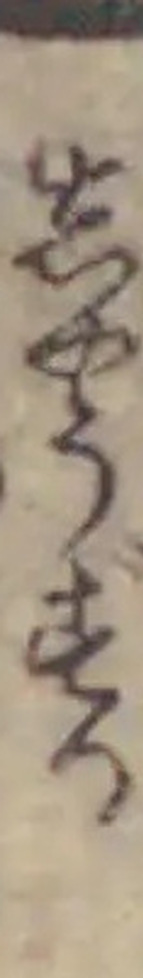しやうずつ
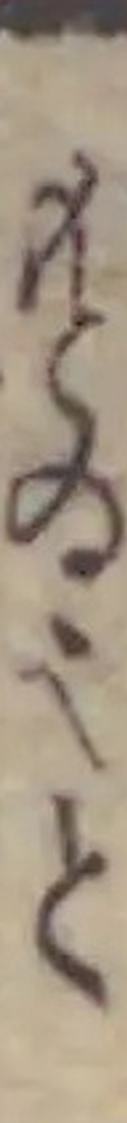もとゐへと
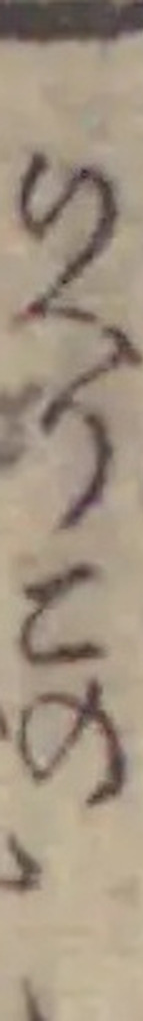いへりこの
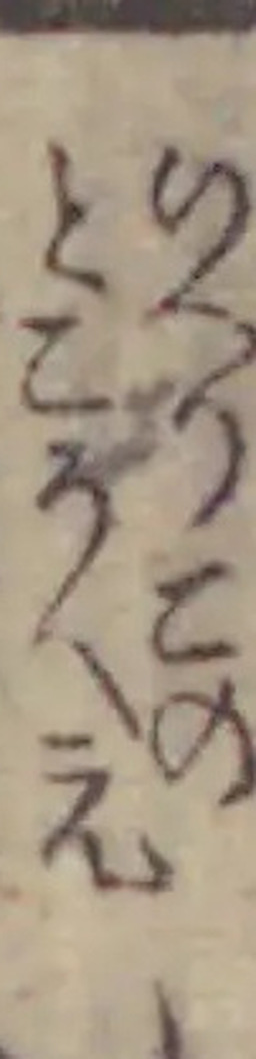ところへ元
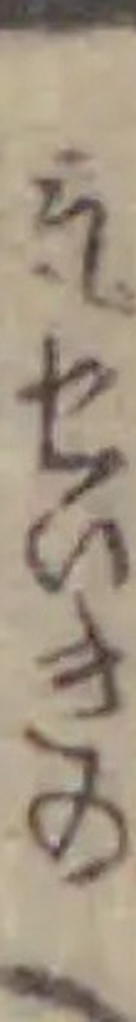気せいきの
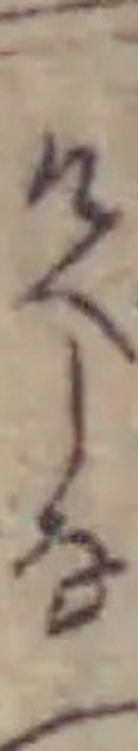けへしな
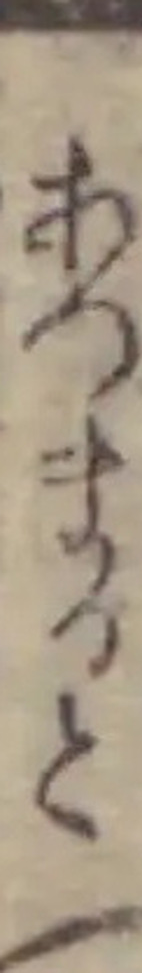あつまると
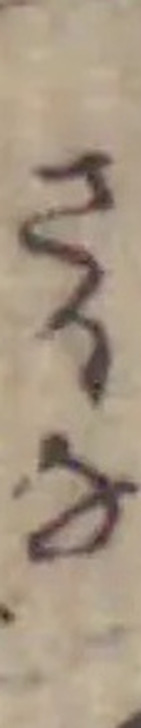さるな
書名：腹内養生主論 3巻
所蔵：国立国会図書館 National Diet Library, JAPAN
